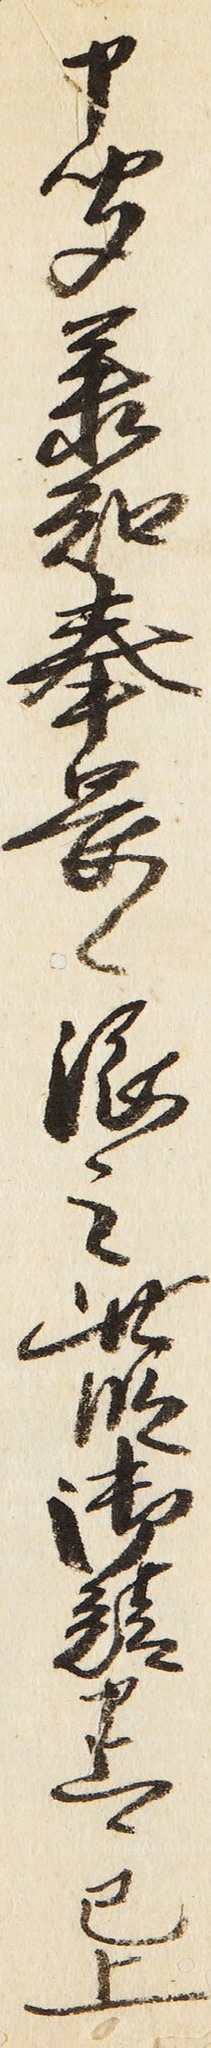申聞承知奉畏候依之此段御請申上候已上
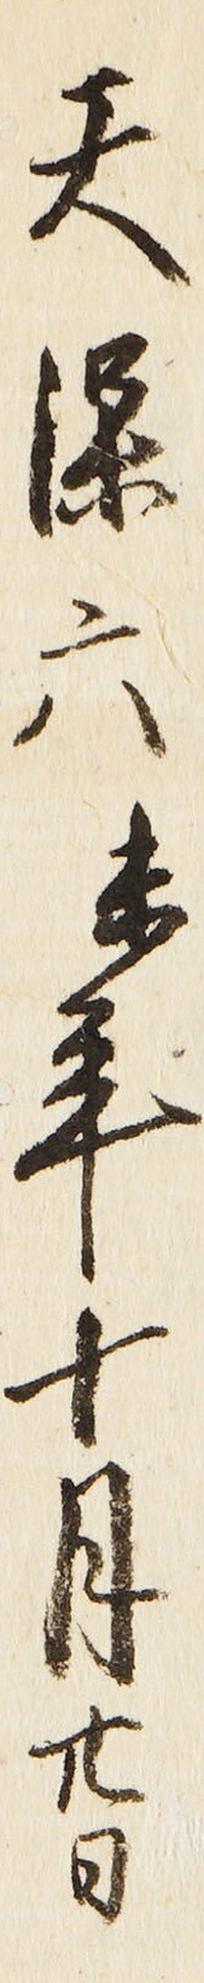天保六未年十月廿日
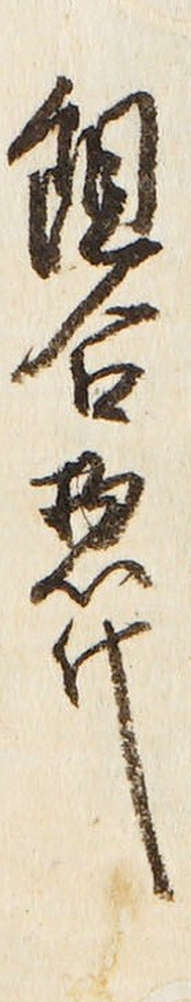組合惣代
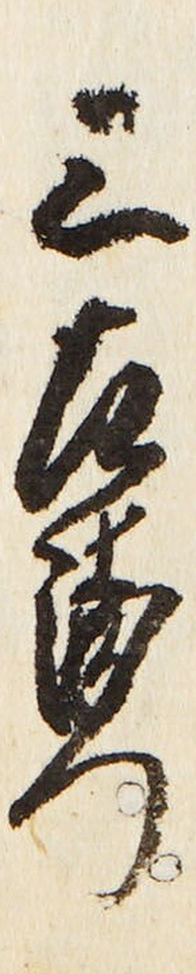三右衛門
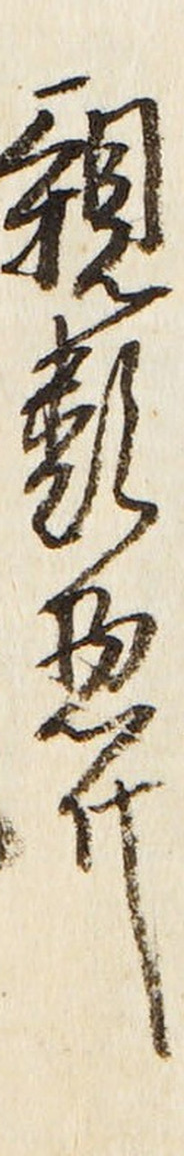親類惣代
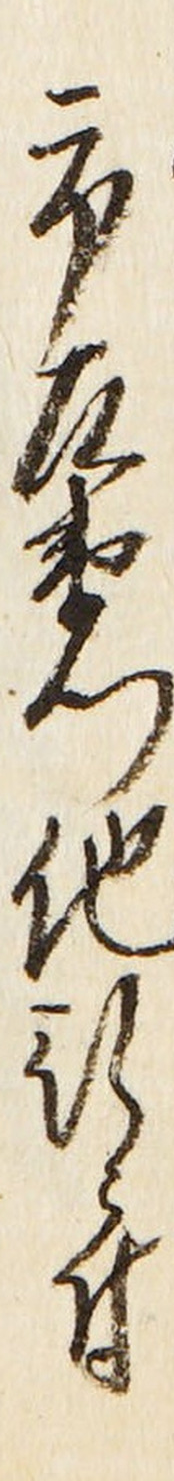市左衛門他領ニ付
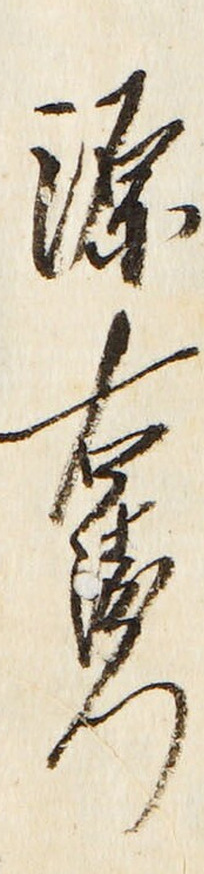源右衛門
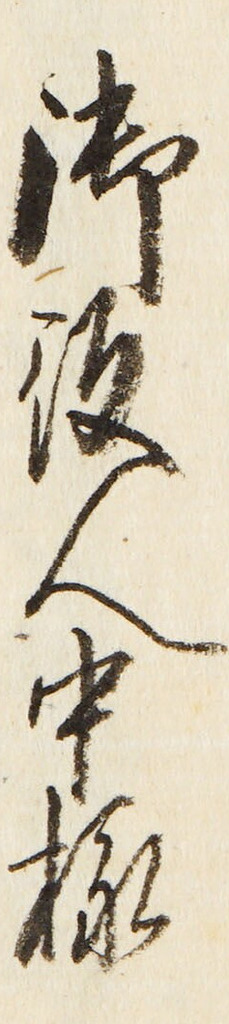御役人中様

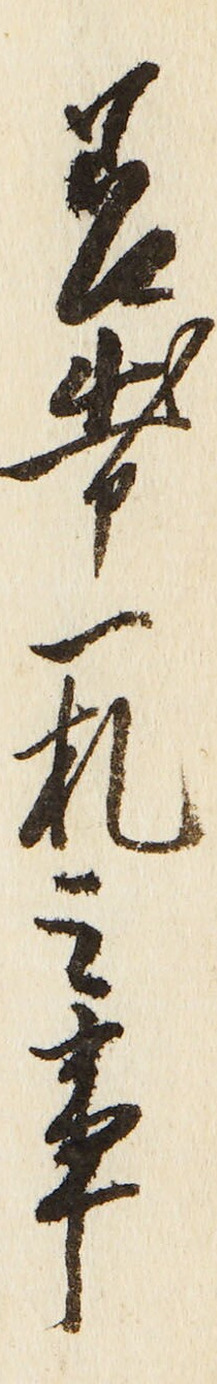差出申一札之事
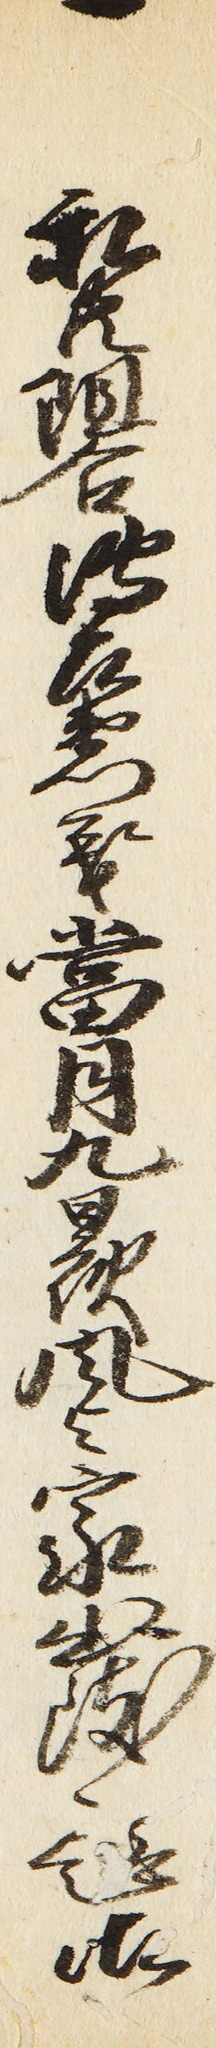一私共組合伝左衛門義当月九日夜風与家出致候趣御
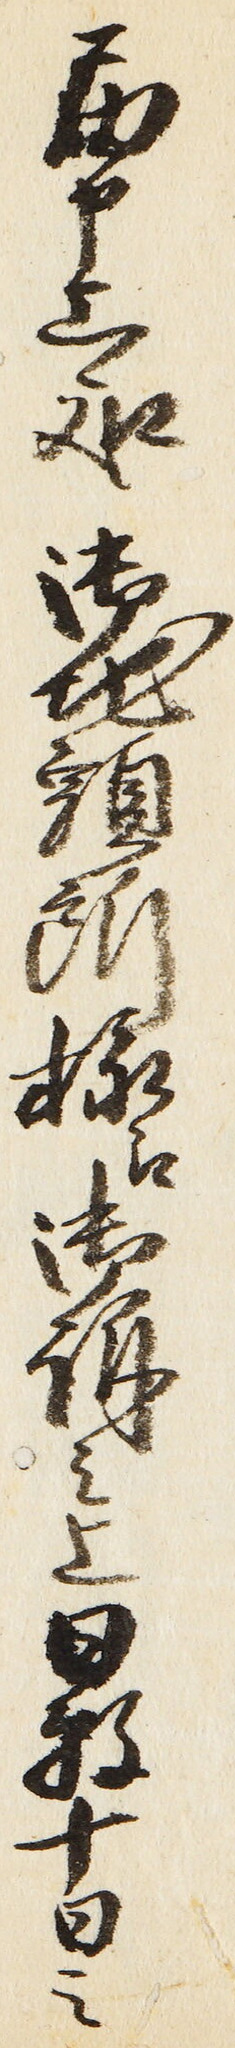届申上候処御地頭所様江御訴之上日数十日之
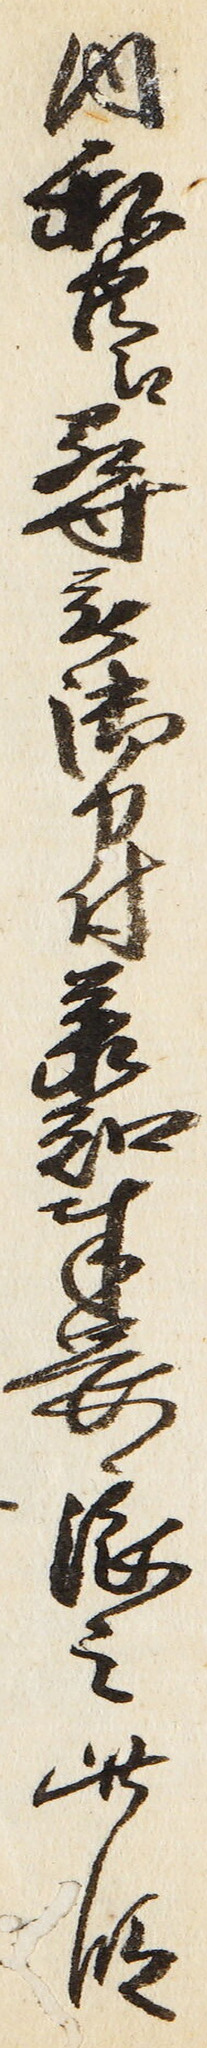内私共江尋被御申付承知奉畏候依之此段
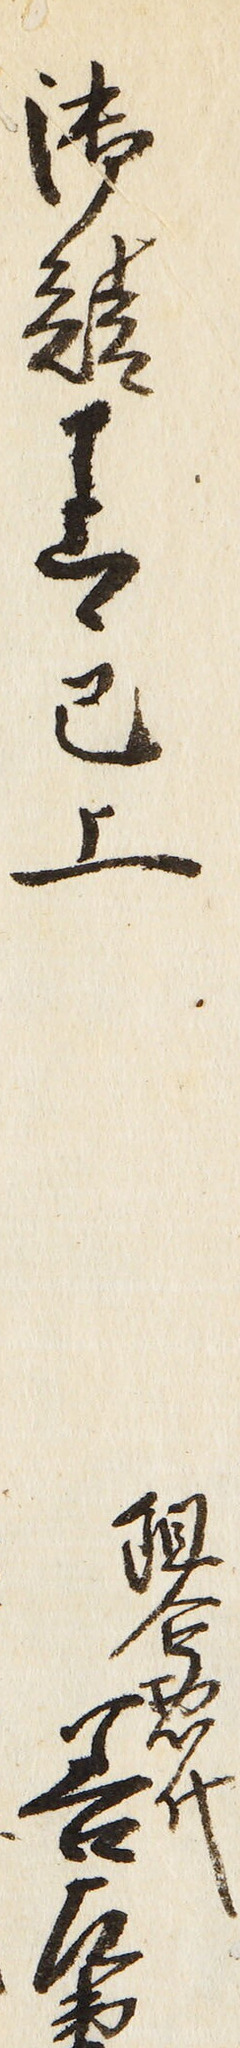御請申上候已上
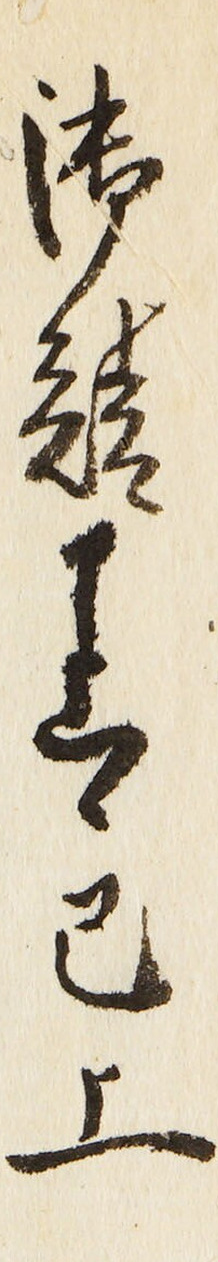御請申上候已上
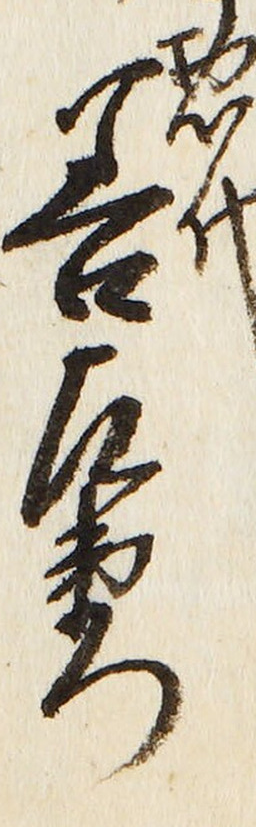善左衛門
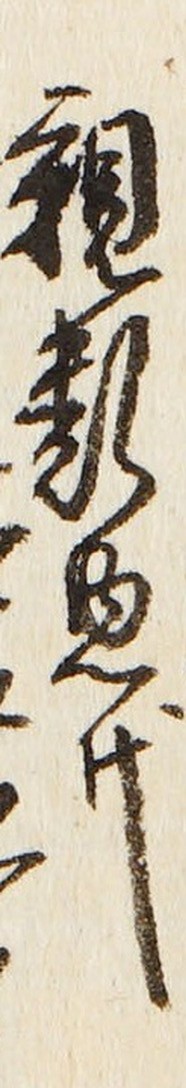親類惣代
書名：難船一件記録
